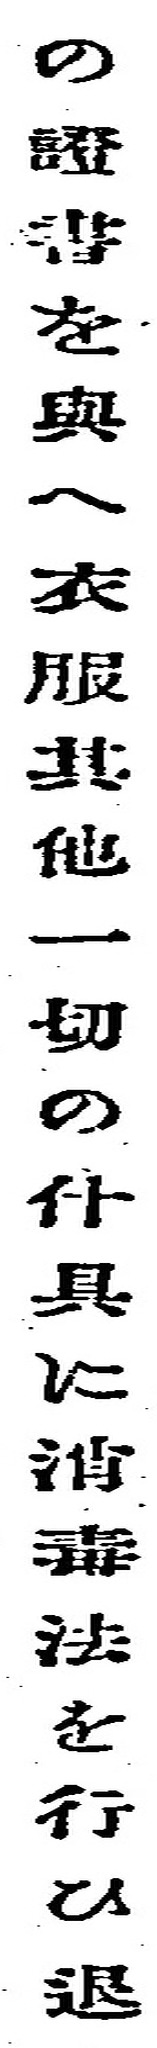の証書を与へ衣服其他一切の什具に消毒法を行ひ退
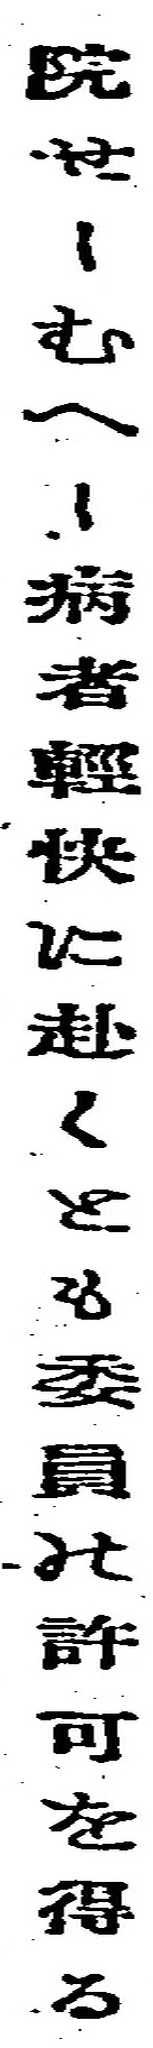院せしむへし病者軽快に赴くとも委員の許可を得る
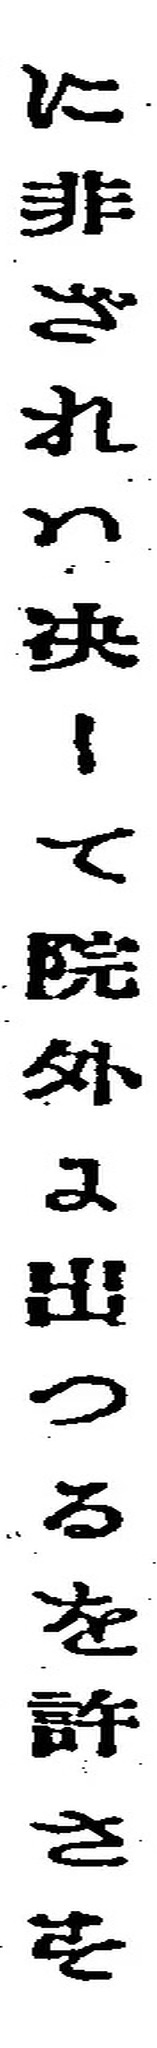に非ざれは決して院外に出つるを許さす
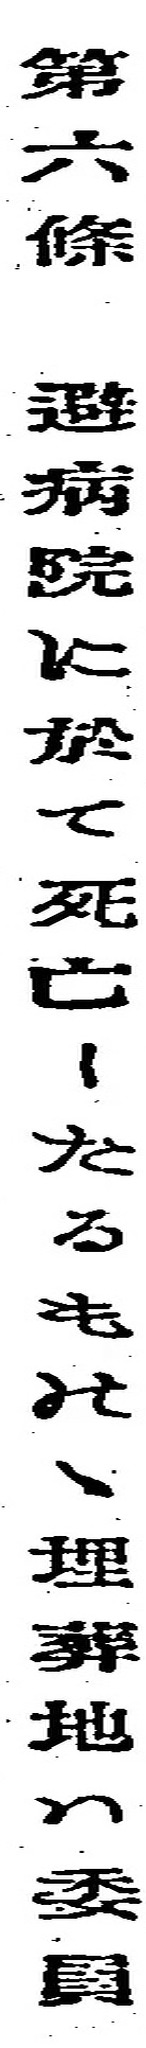第六条避病院に於て死亡したるものゝ埋葬地は委員
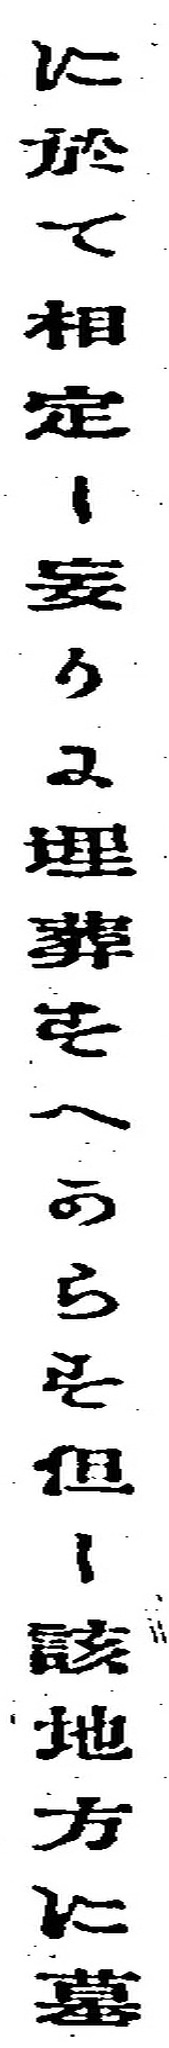に於て相定し妄りに埋葬すへからす但し該地方に墓
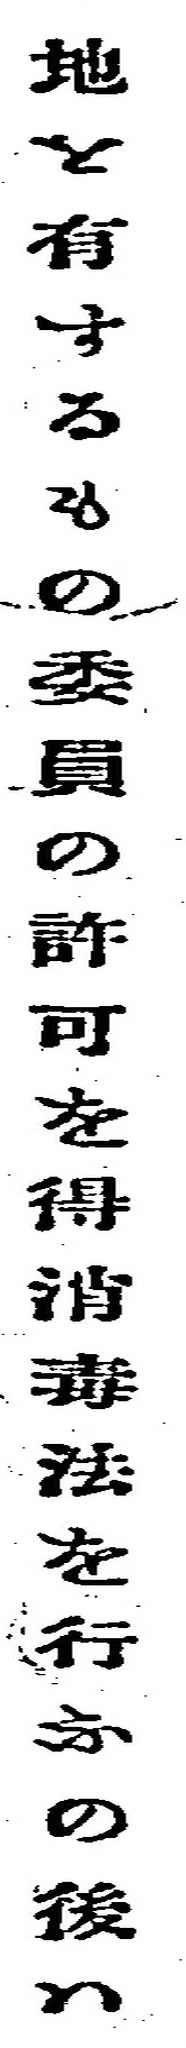地を有するもの委員の許可を得消毒法を行ふの後は
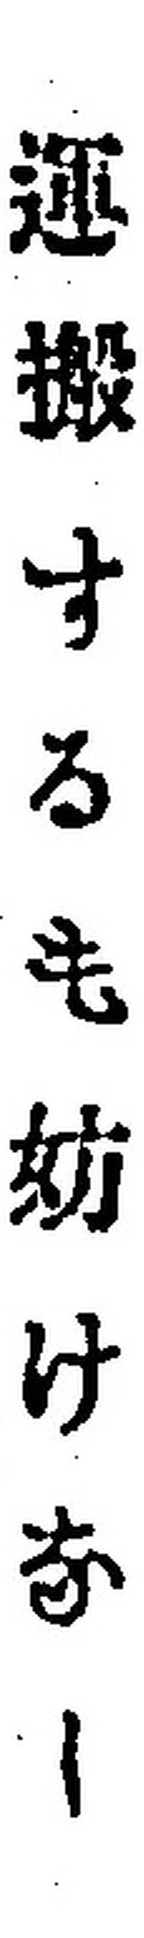運搬するも妨けなし
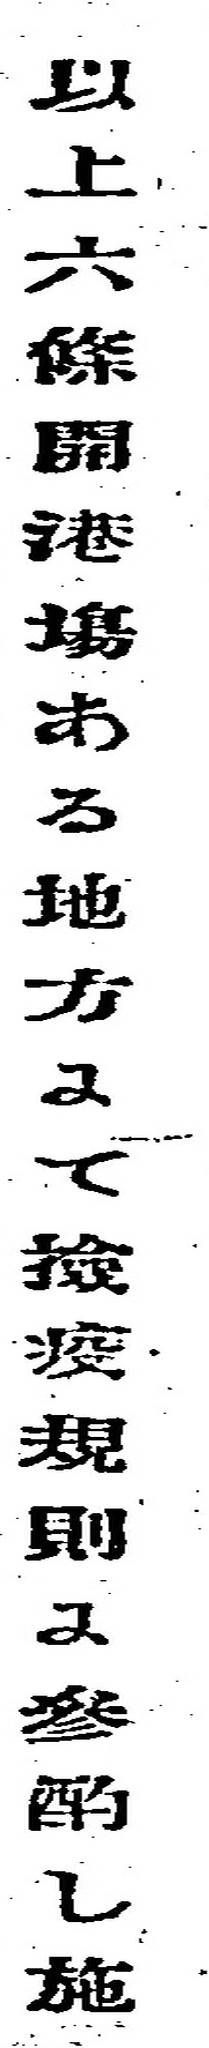以上六条開港場ある地方にて撿疫規則に参酌し施
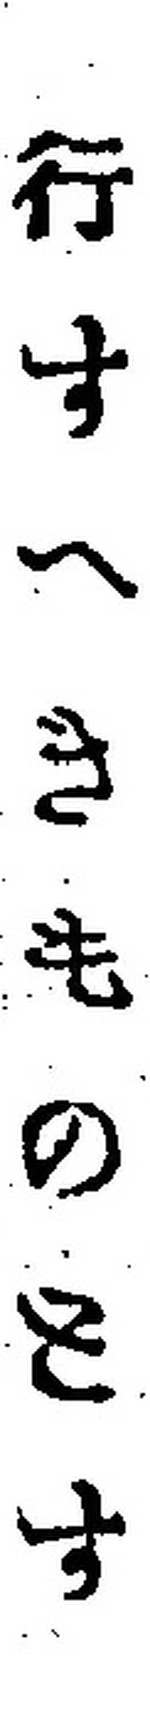行すへきものとす
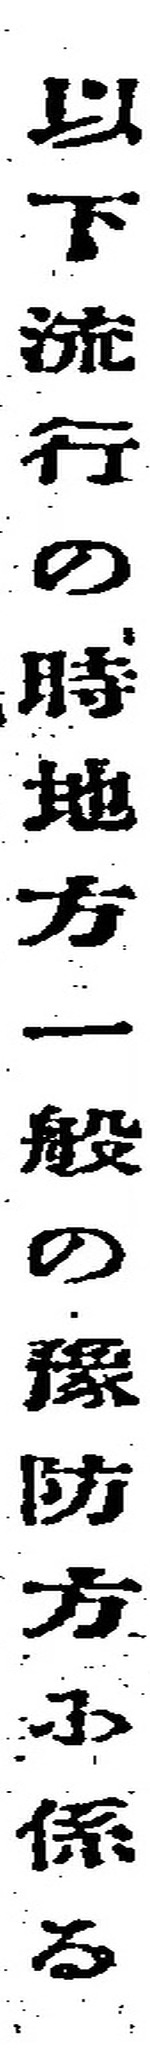以下流行の時地方一般の予防方に係る

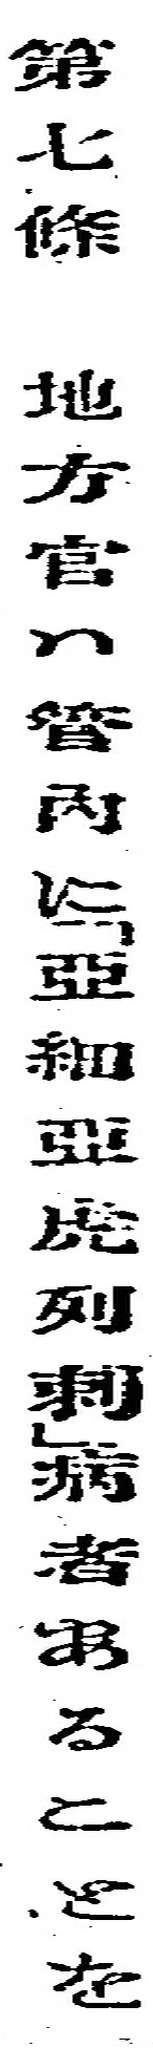第七条地方官は管内に「亜細亜虎列刺」病者あることを
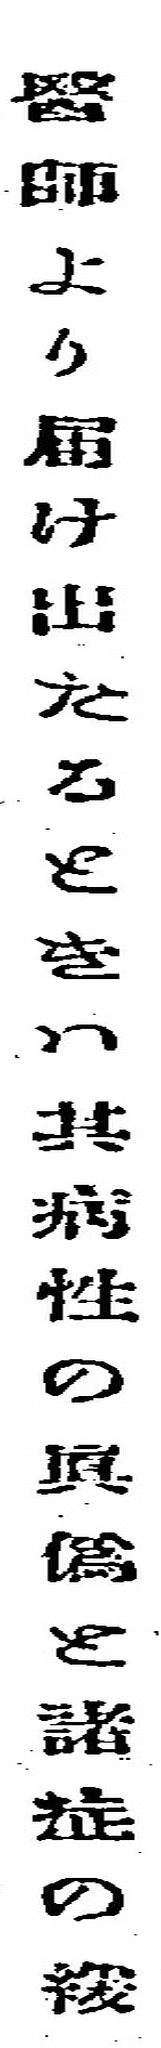医師より届け出たるときは其病性の真偽と諸症の緩
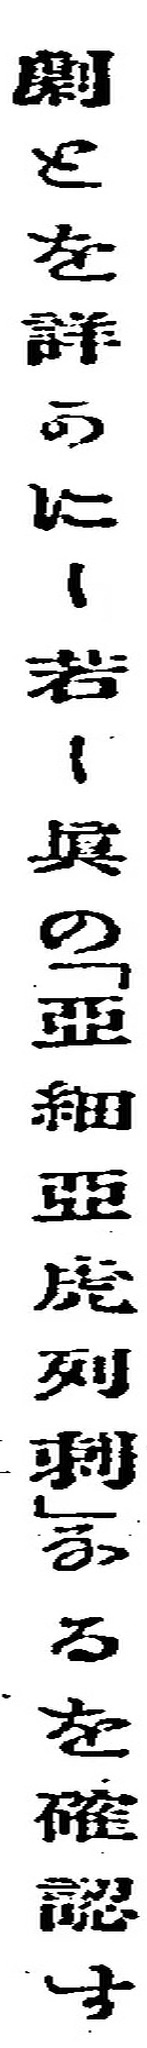劇とを詳かにし若し真の「亜細亜虎列刺」なるを確認す
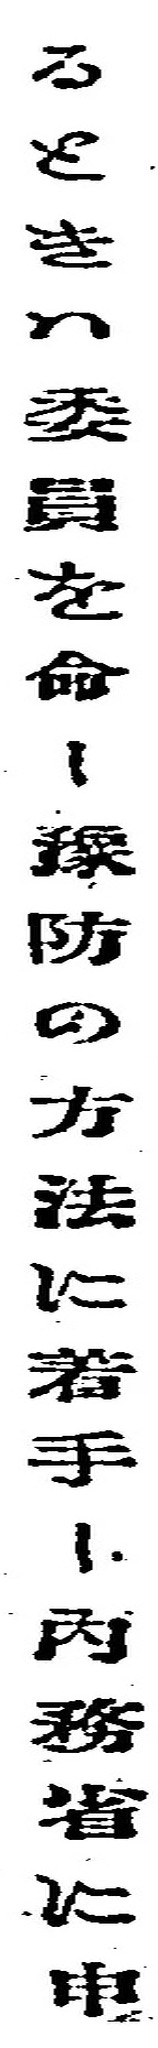るときは委員を命し予防の方法に着手し内務省に申
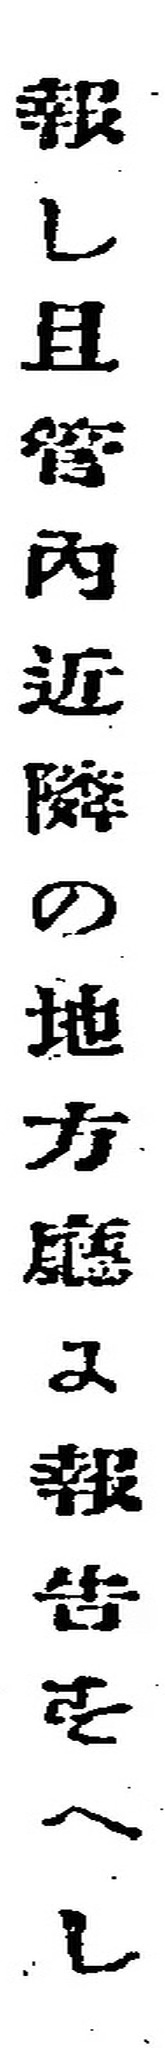報し且管内近隣の地方庁に報告すへし
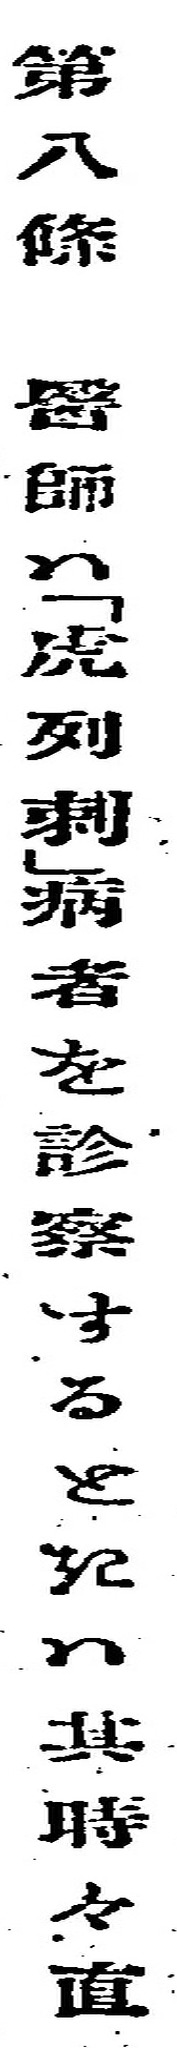第八条医師は「虎列刺」病者を診察するときは其時々直
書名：これら病予防心得
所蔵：国立国会図書館 National Diet Library, JAPAN
